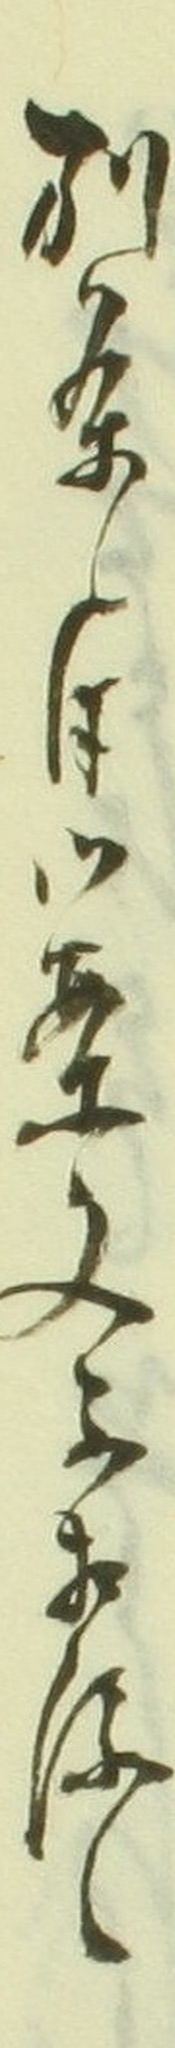別条候付御案文不相添候
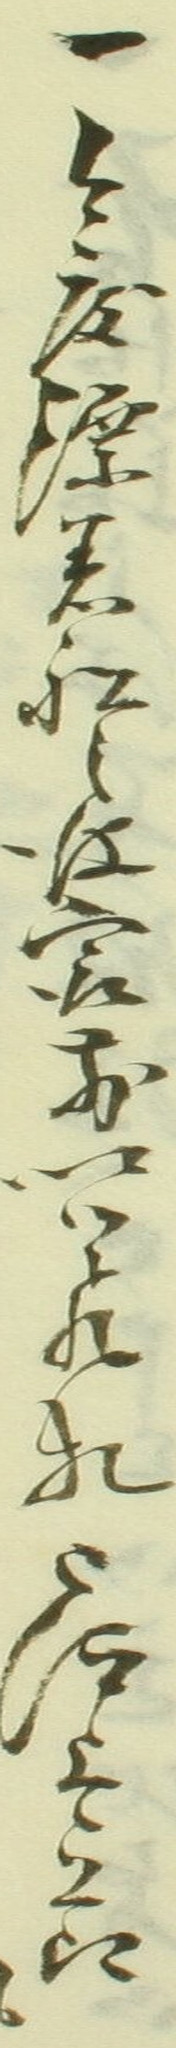一今度漂着船之儀最前以御飛札被仰上候節も
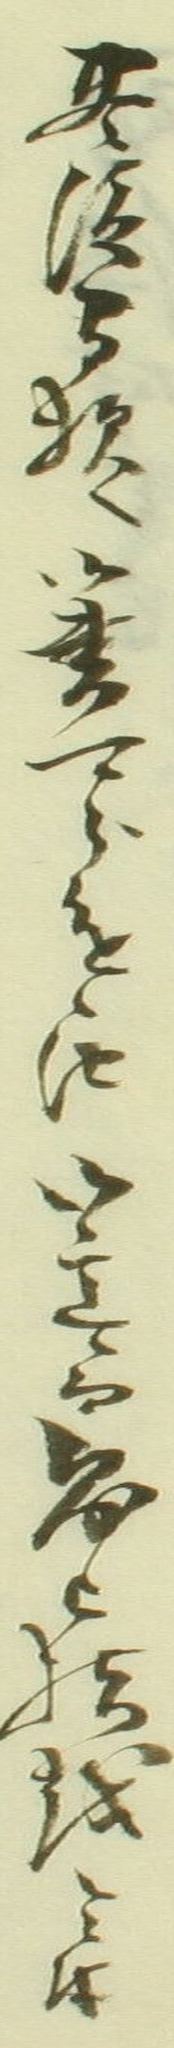豊後守様へ御書可被進候由御意ニ而則指越候ニ付
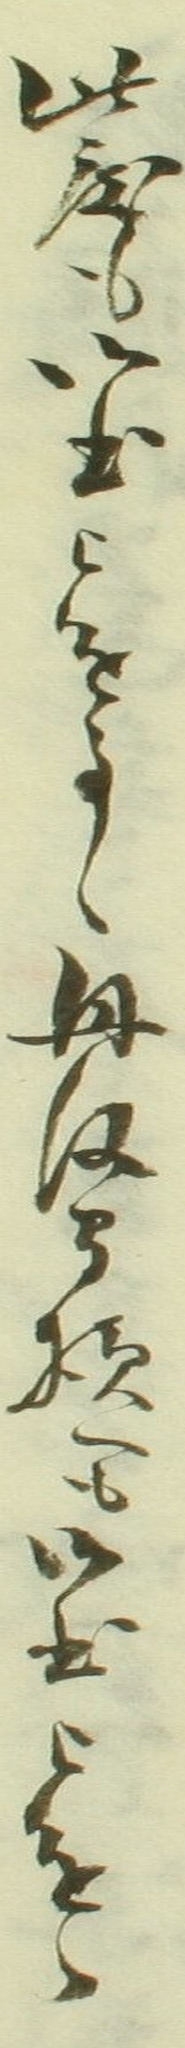此度も御書被進事候丹波守様へも御書被進候
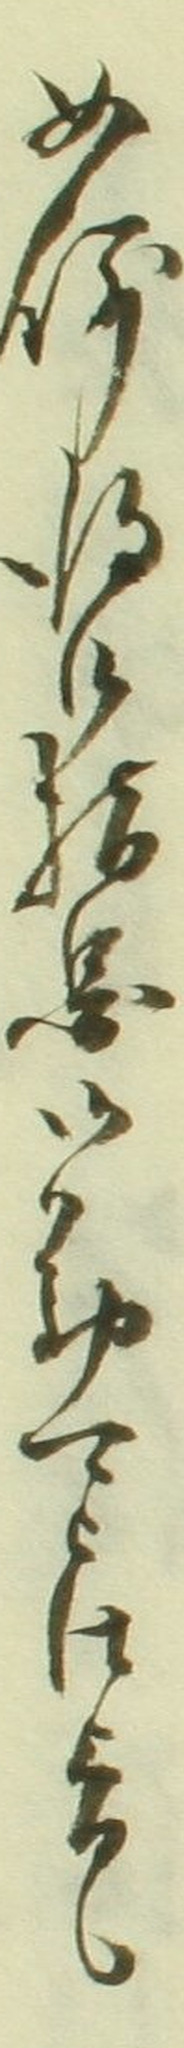如例得御指図御勤可被仕旨候
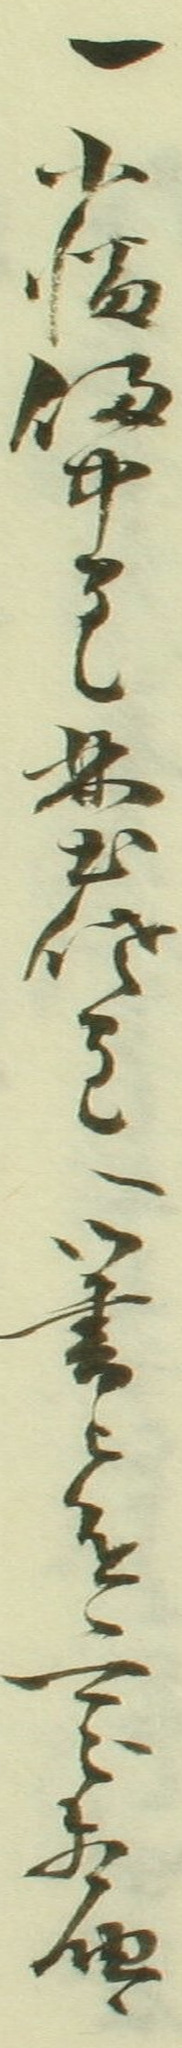一小幡備中守殿林土佐守殿へ御書被進候可被相届候
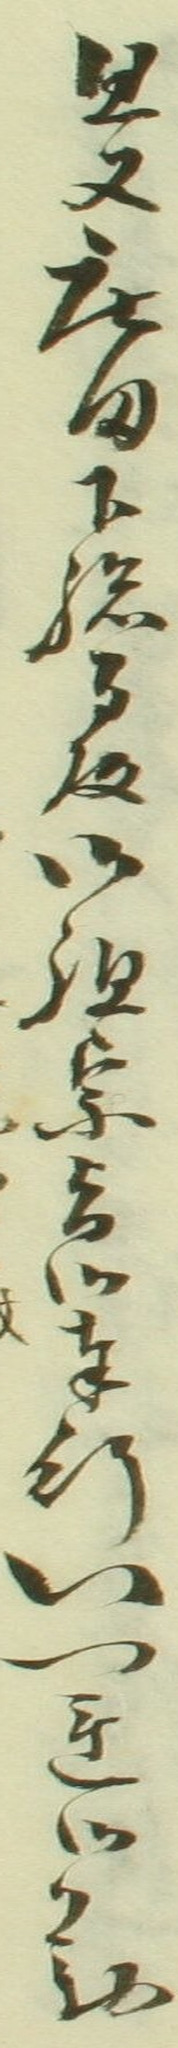且又庄田下総守殿御組宗旨御奉行いつれ御勤
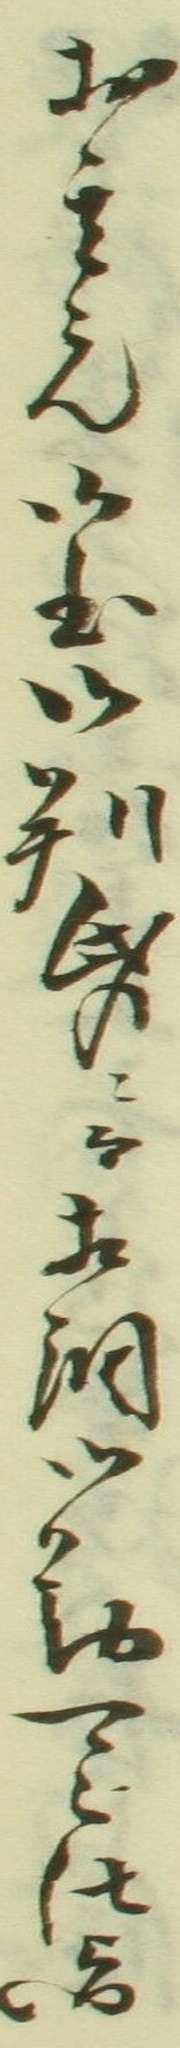於其元御書御判紙ニ而相調御勤可被仕旨候

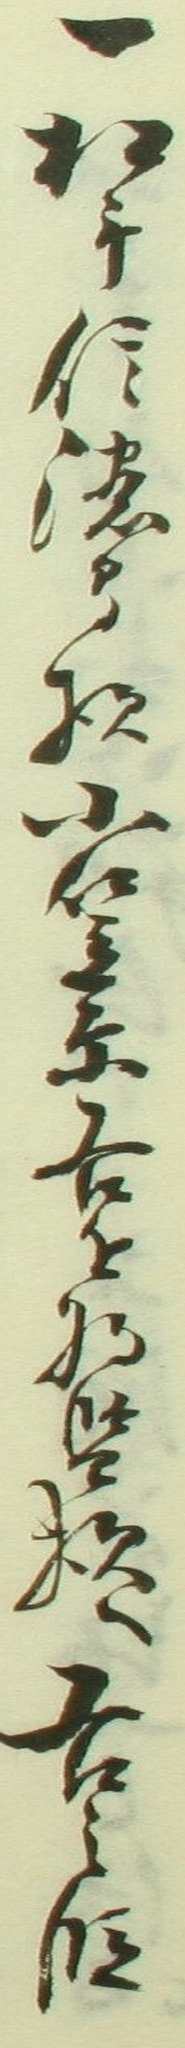一松平信濃守様小笠原右近将監様へ右之段
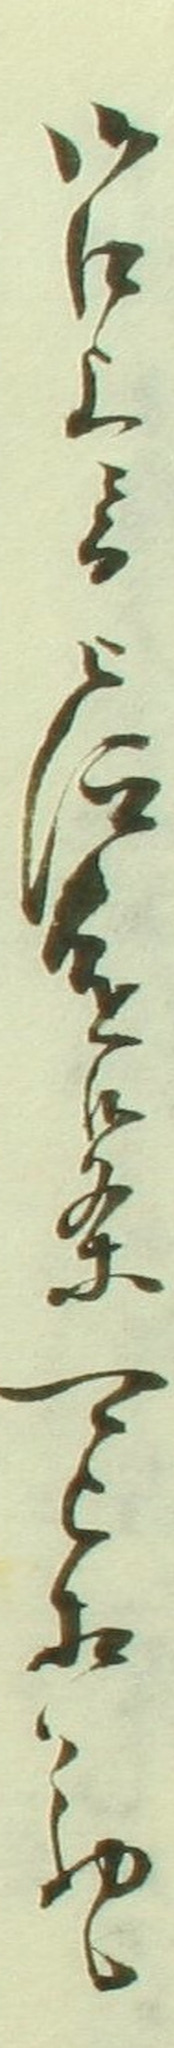御口上ニ而被仰進候条可被相勤候
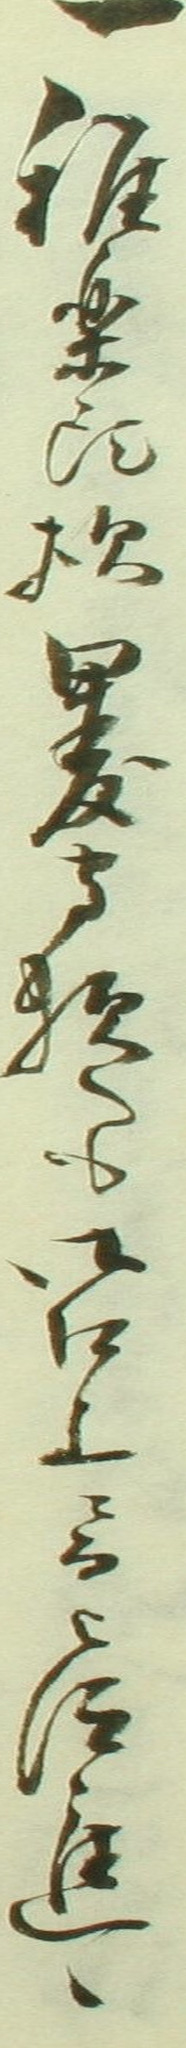一雅楽頭様甲斐守様へも御口上ニ而被仰進候
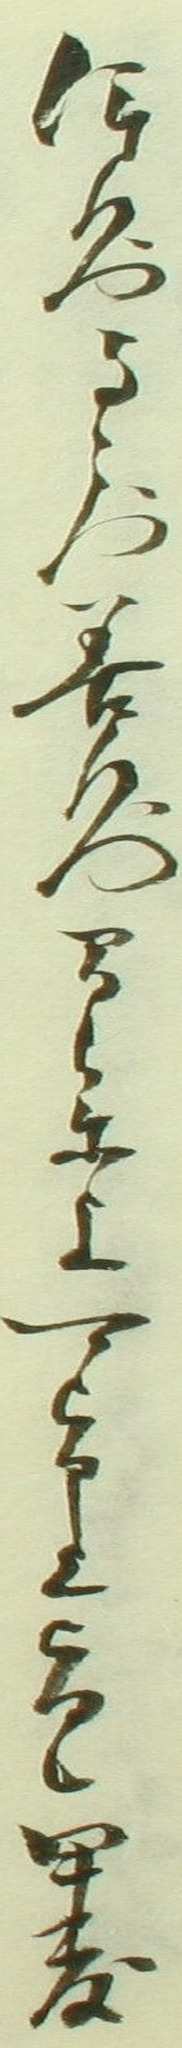伊左衛門与右衛門善左衛門等参上可被申上旨候甲斐
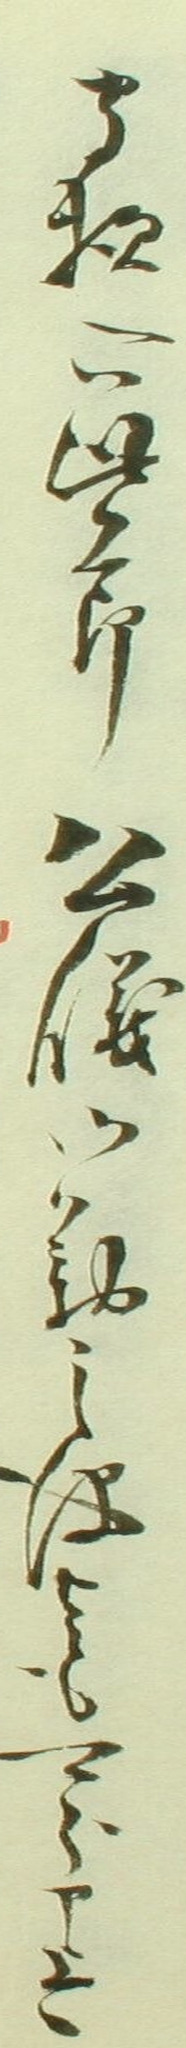守様へハ此節公儀御勤之儀とても可被申上候
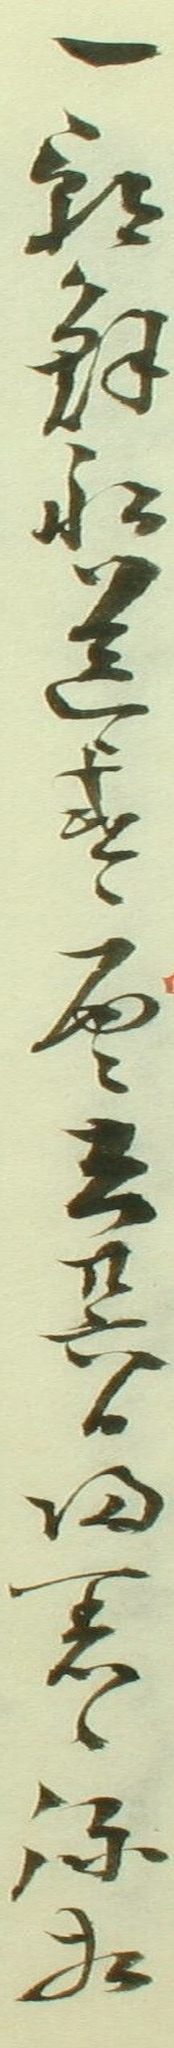一朝鮮船送被遣候面々去廿六日帰着候弥相
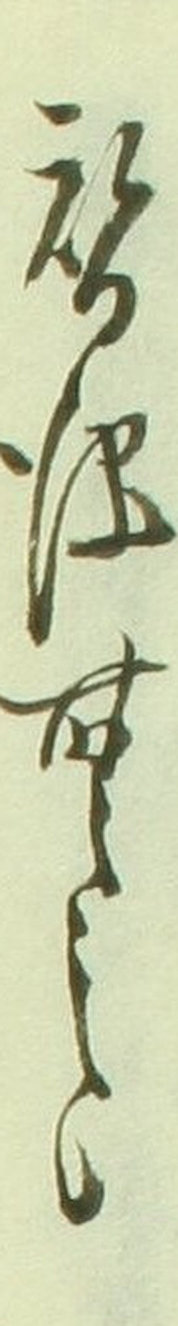替儀無之候
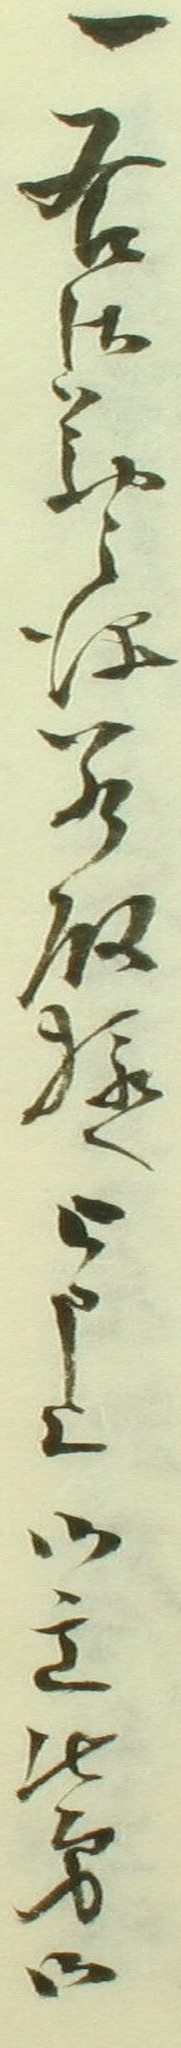一右御勤之儀若殿様へ被申上御意次第御
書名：異国船漂着記
